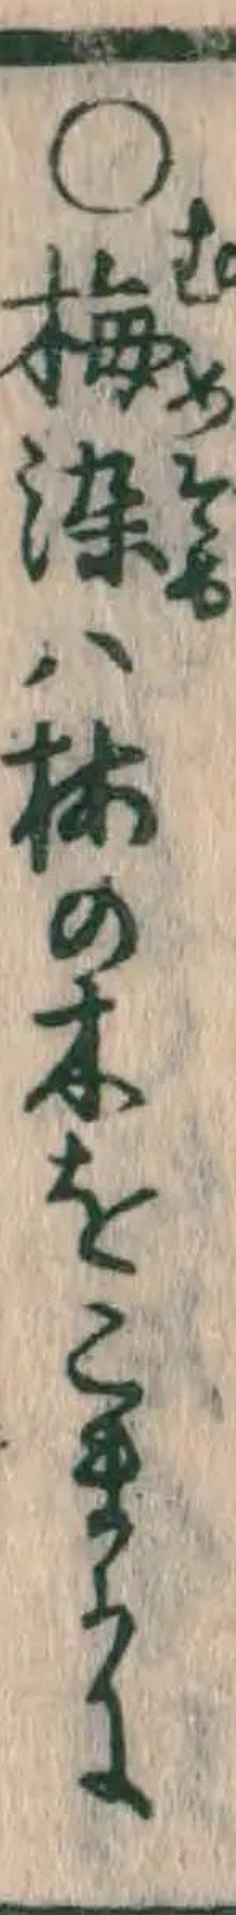○梅染は梅の木をこまかに
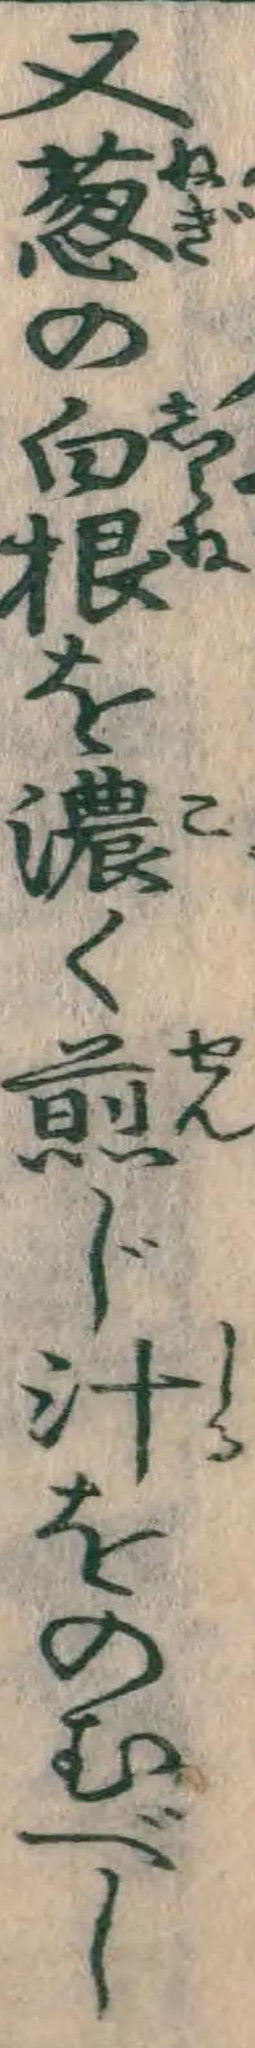又葱の白根を濃く煎じ汁をのむべし
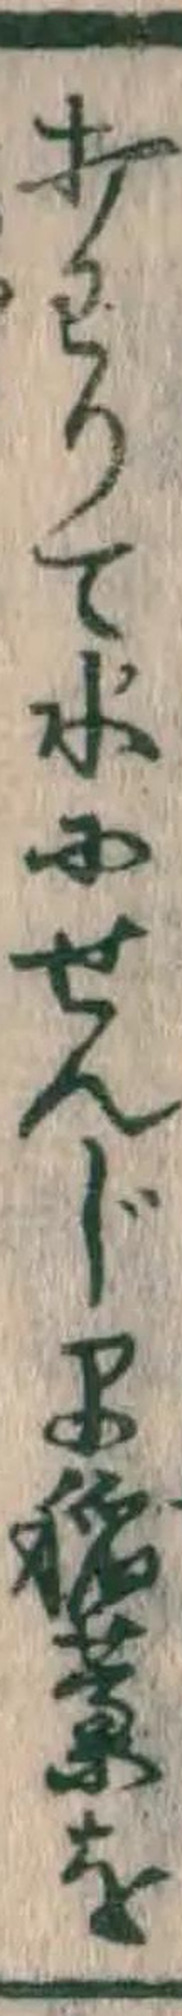打わりて水にせんじ早稲藁を
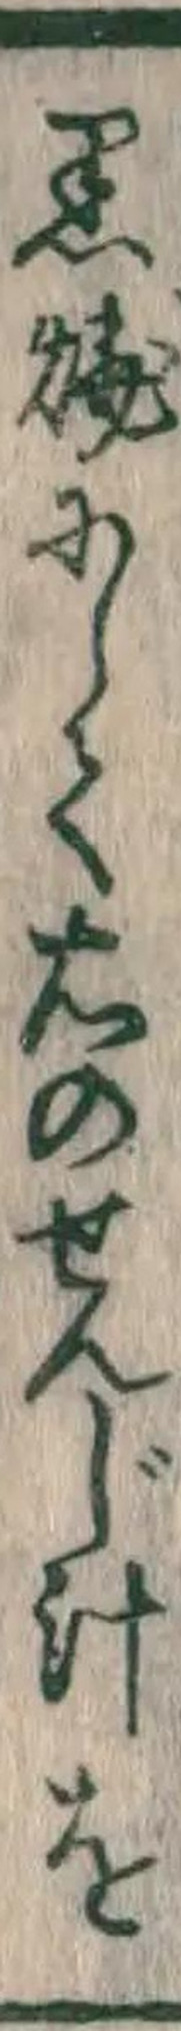黒焼にして右のせんじ汁を
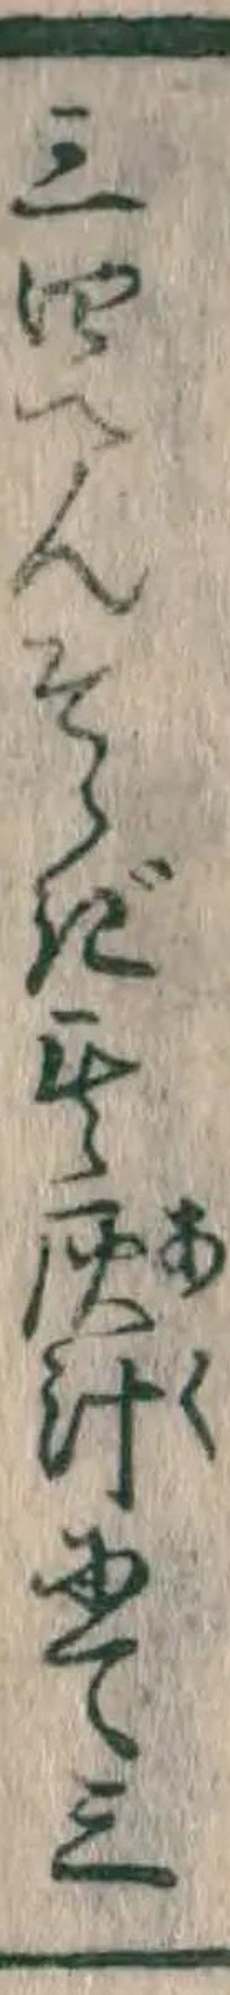三四へんそゝぎ其灰汁にて三
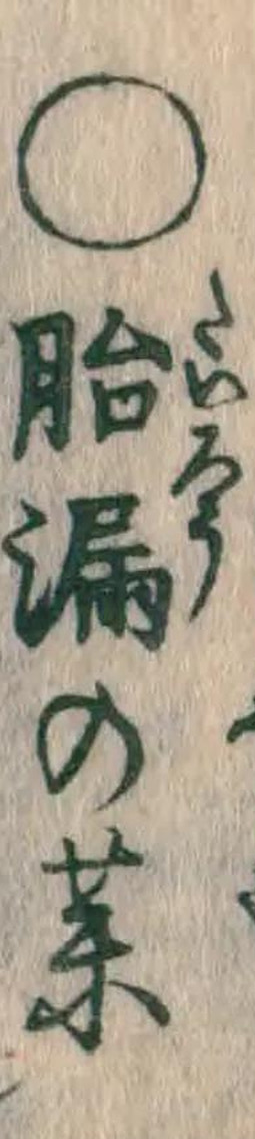○胎漏の薬
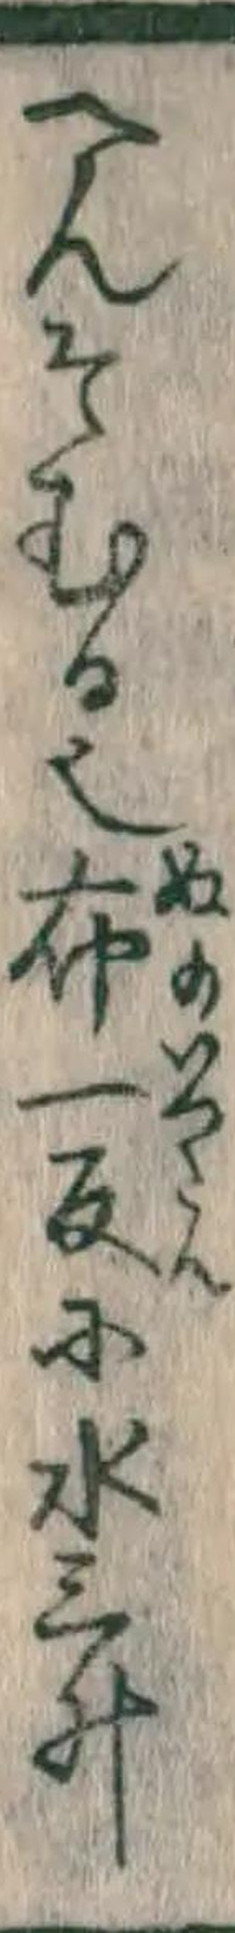へんそむる也布一反に水三升
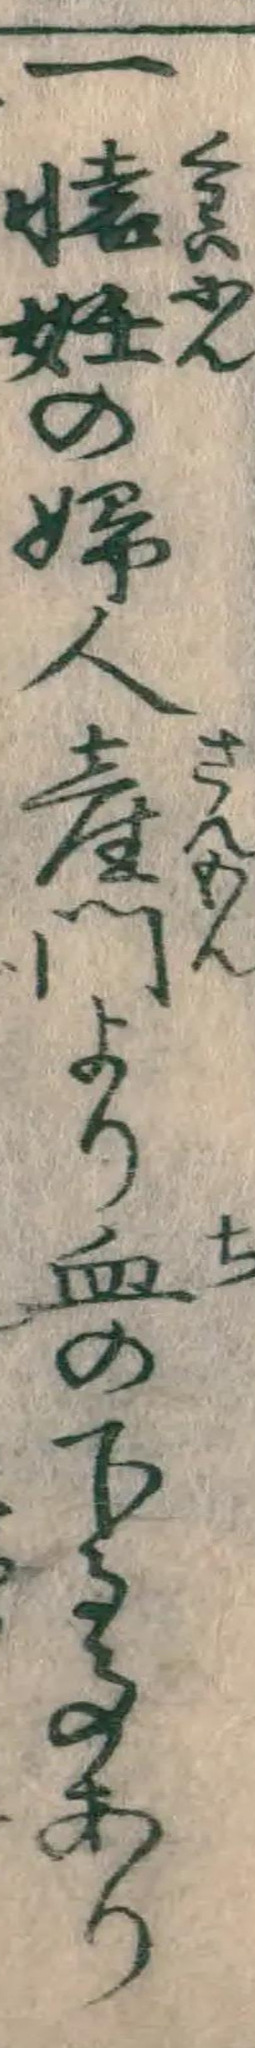一懐妊の婦人産門より血の下る事あり
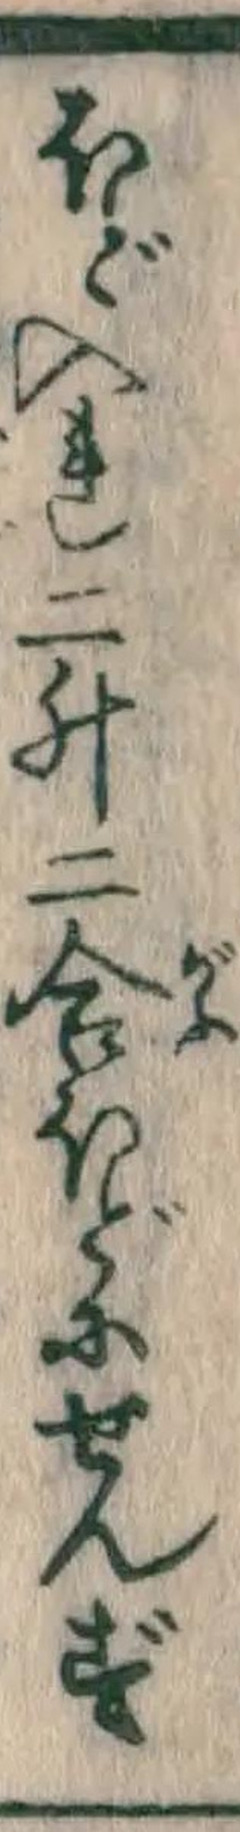ほど入れ二升二合ほどにせんず
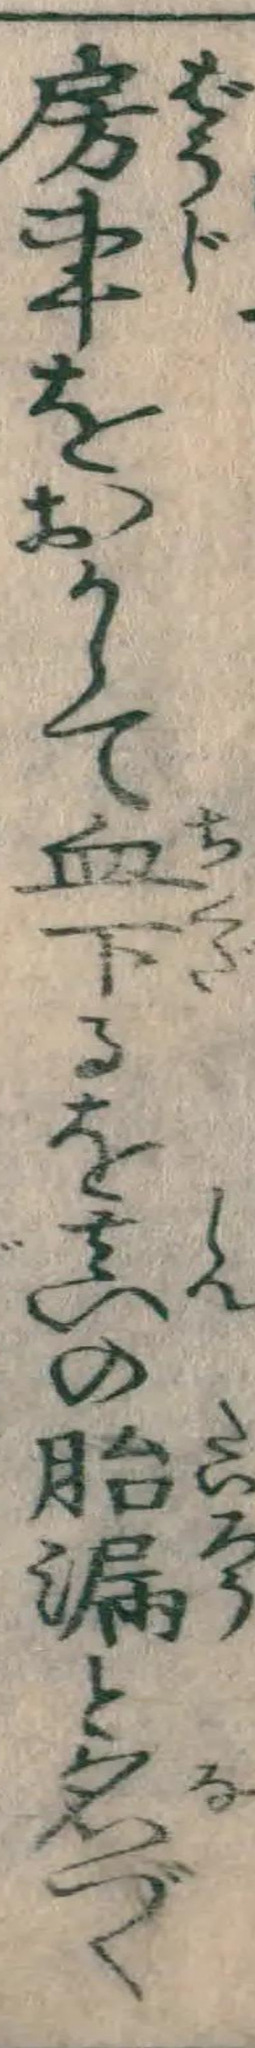房事をおかして血下るを真の胎漏と名づく
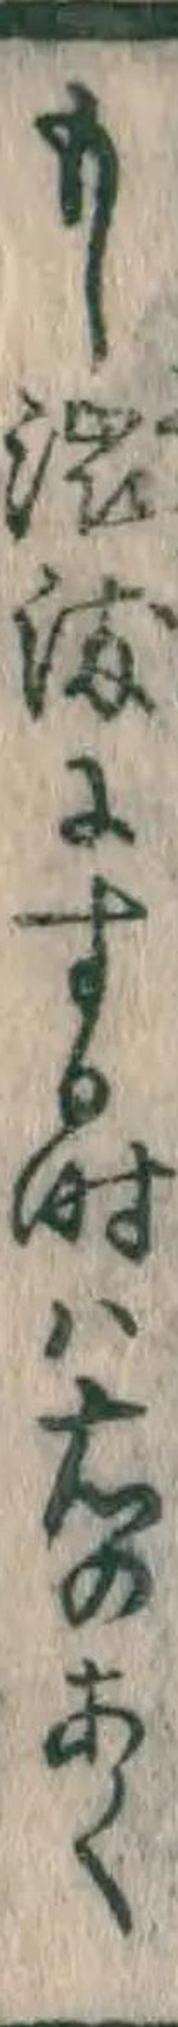もし渋染にする時は右のあく
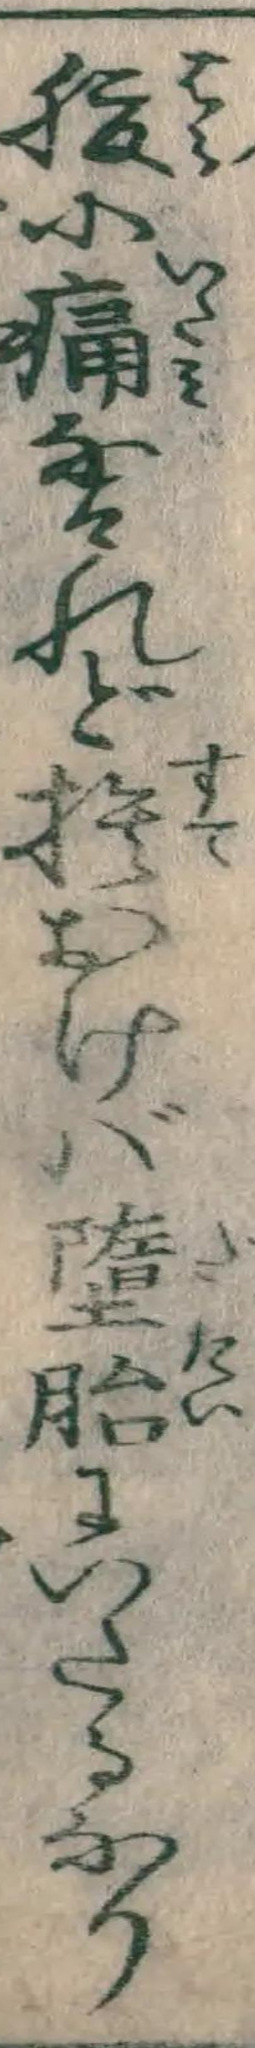腹に痛なけれど捨おけば堕胎にいたるなり
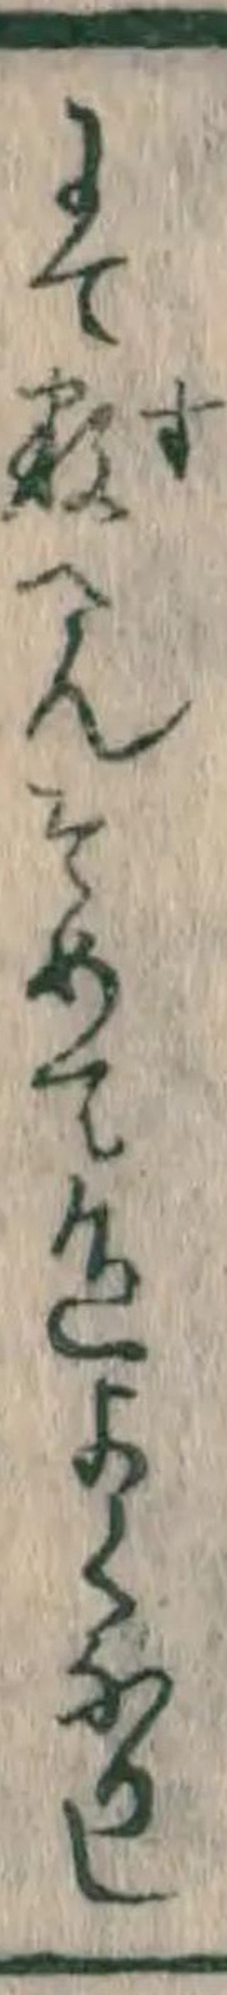にて数へんそめて色よくなりし
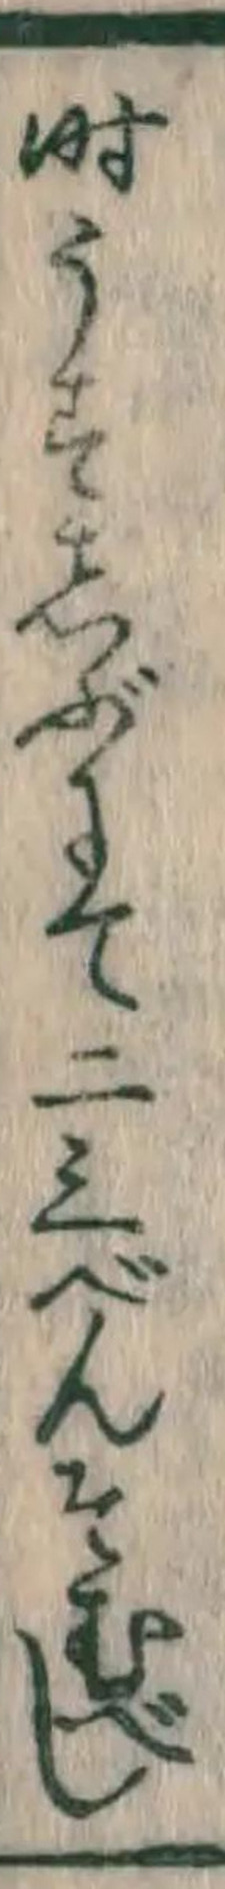時うすしぶにて二三べんそむべし
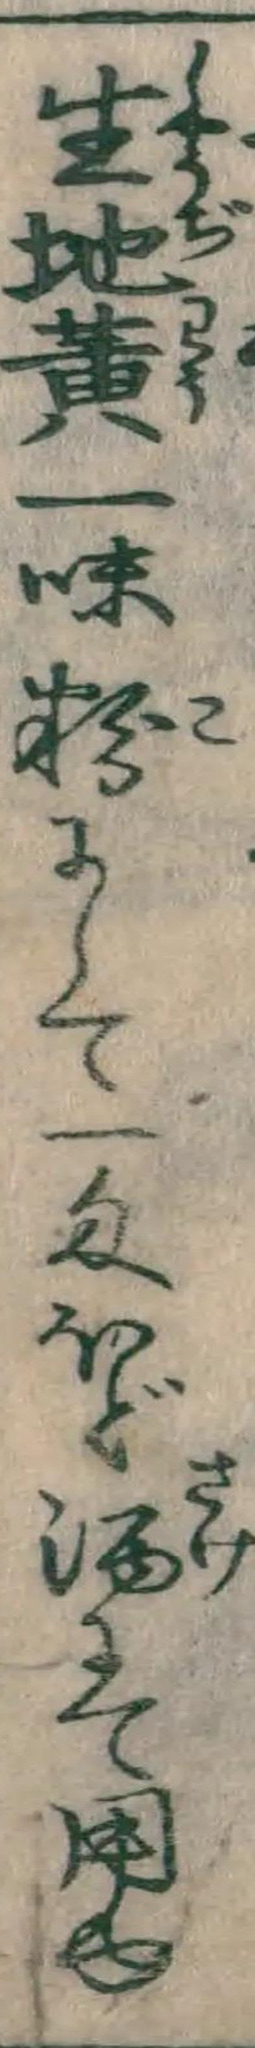生地黄一味粉にして一匁ほど酒にて用ゆ

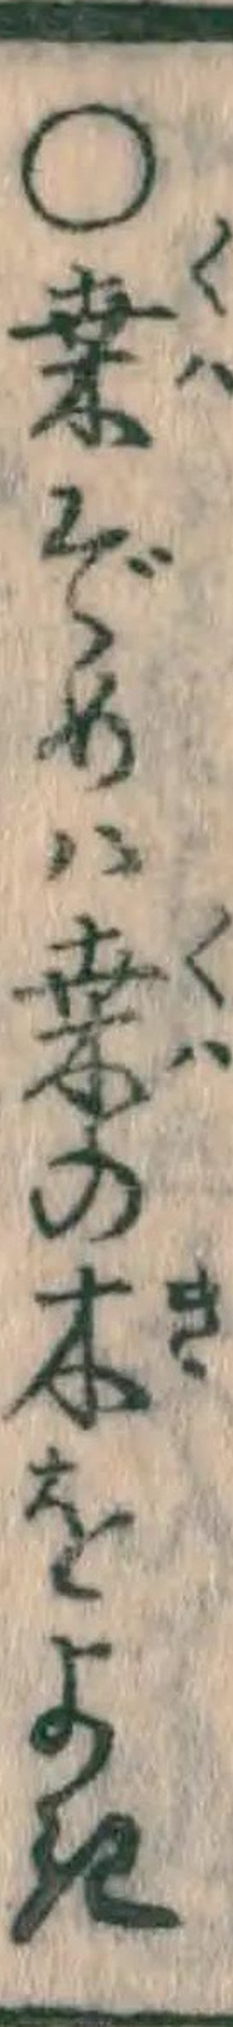○桑ぞめは桑の木をよき
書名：広益秘事大全 3巻. [3]
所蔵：国立国会図書館 National Diet Library, JAPAN
